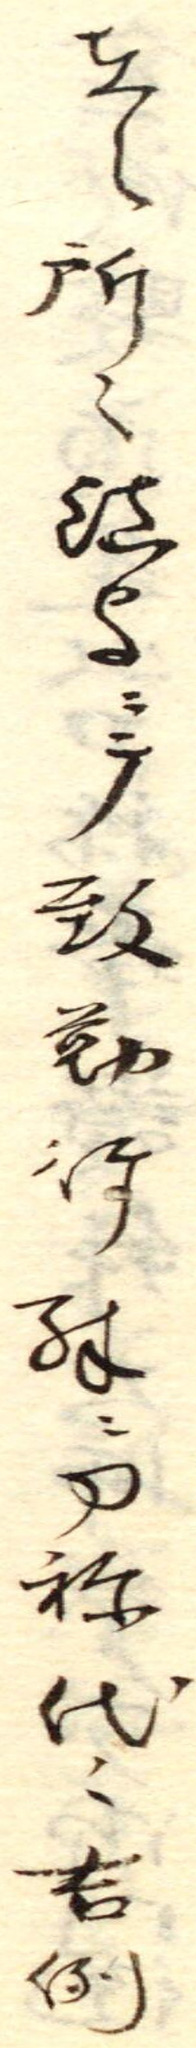在之所々鎮守にて致勤行殊に刀祢代々吉例
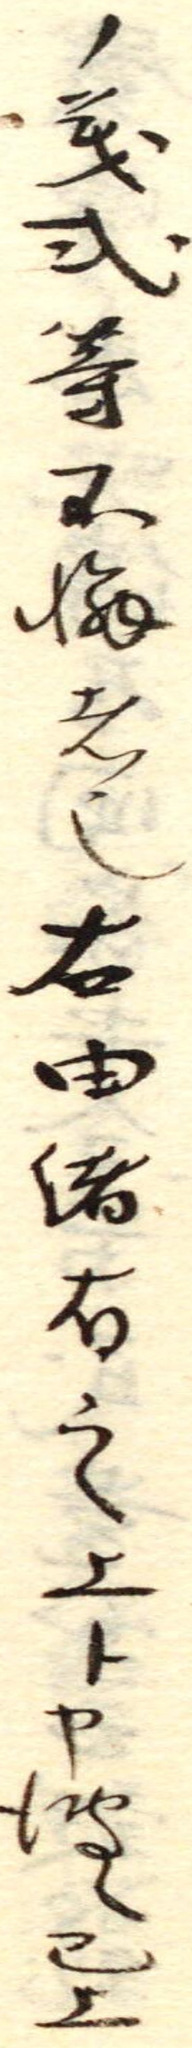ノ義式等不懈者也右由緒有之上と申伝之已上
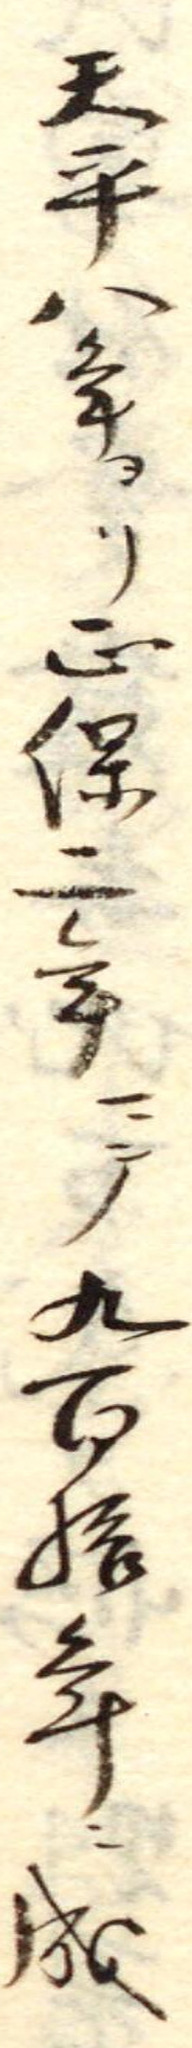天平八年より正保二年まて九百年に成
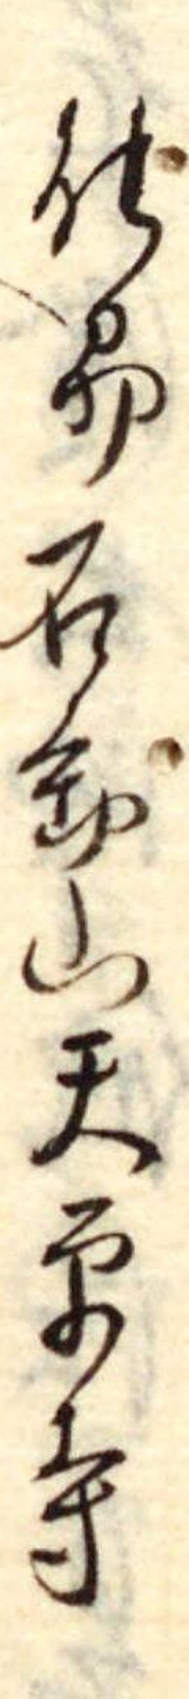能州石動山天平寺
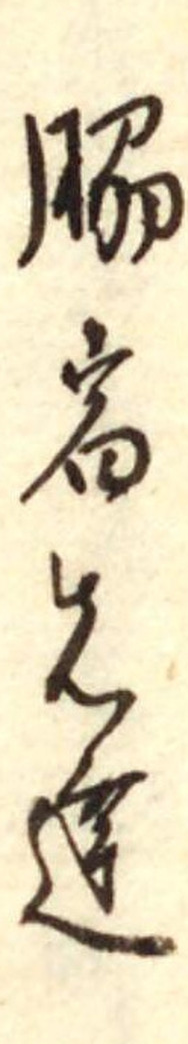脇宿先達
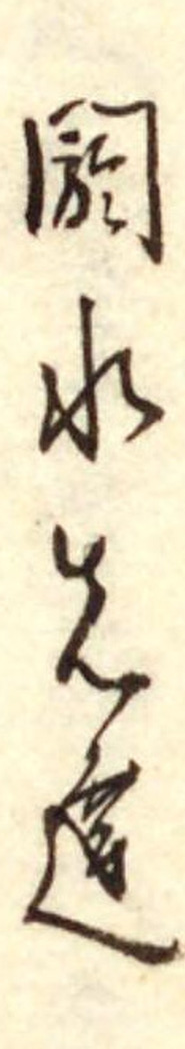閼水先達
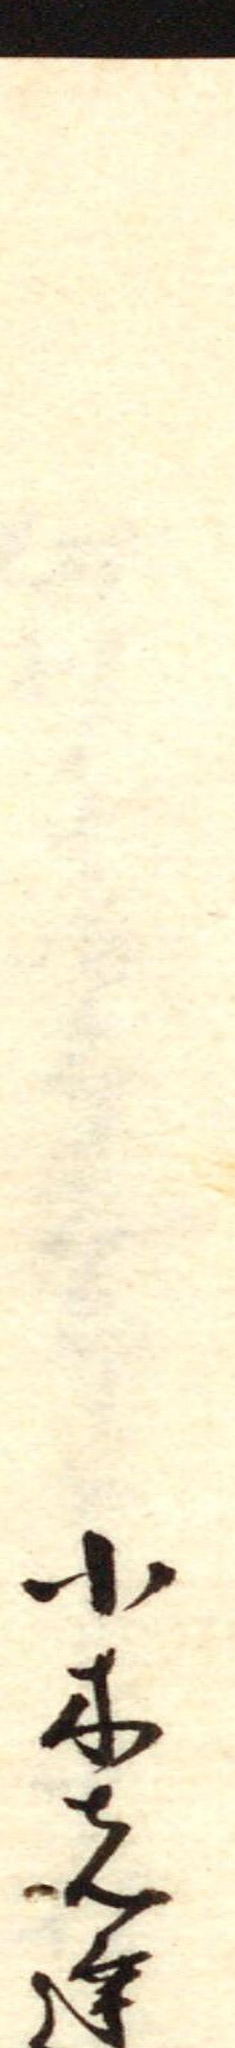小木先達
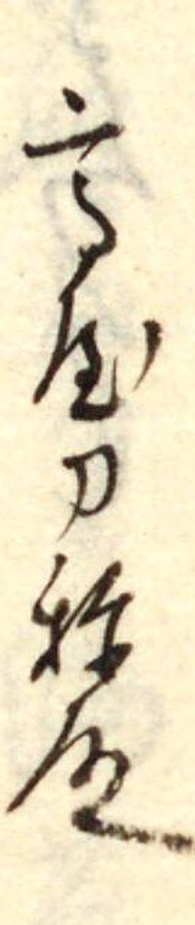高屋刀祢殿
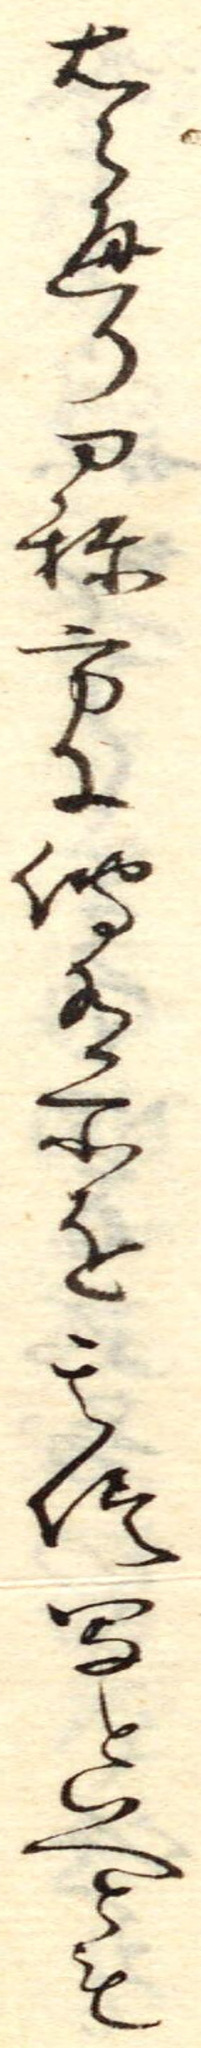右之通り刀祢方に伝有所を其侭写といへとも
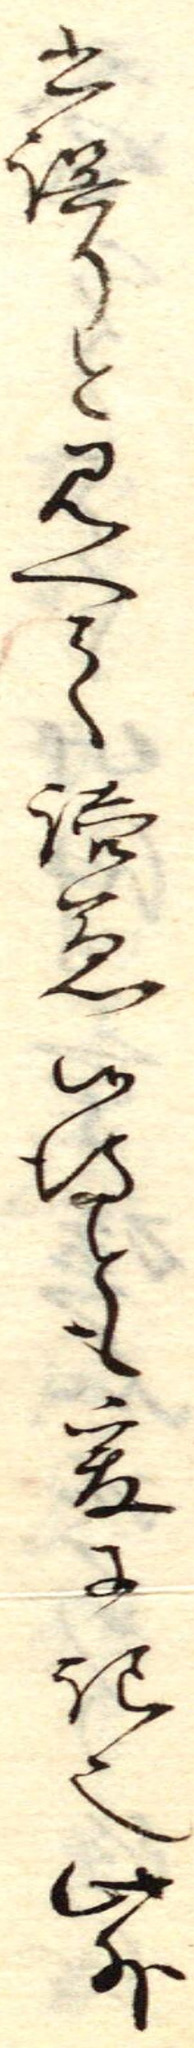書誤りと見へて読兼候得とも爰に記也此外
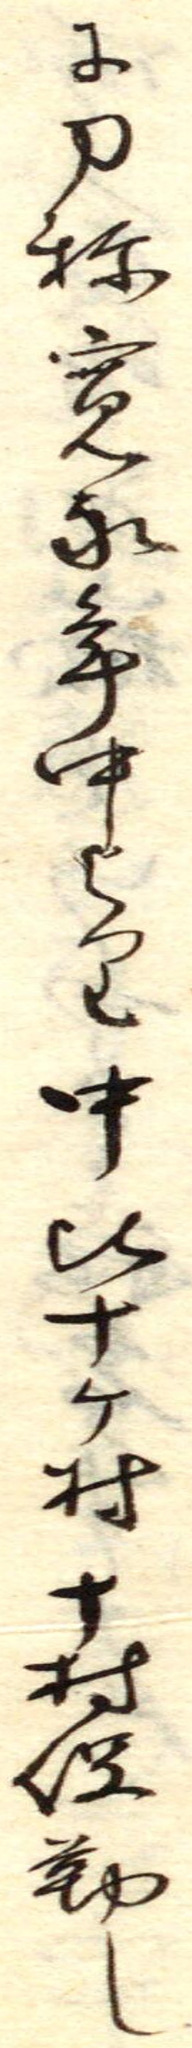に刀祢寛永年中より中比十ヶ村十村役勤し
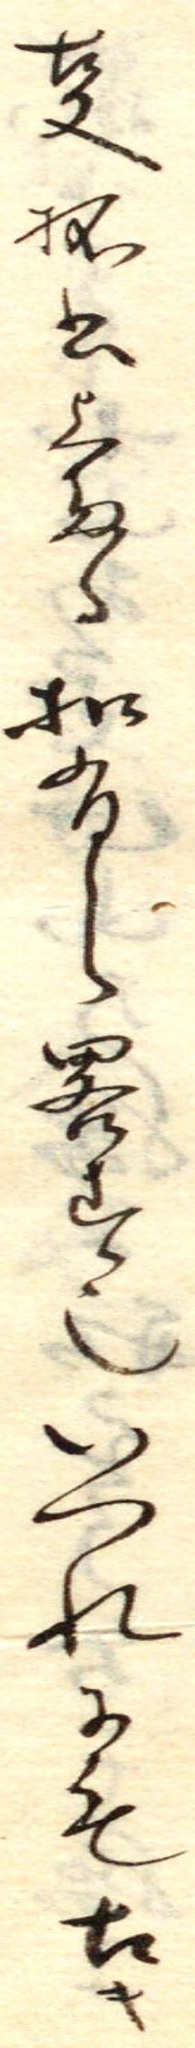事抔書上たる扣有しに略す也いつれにも古き
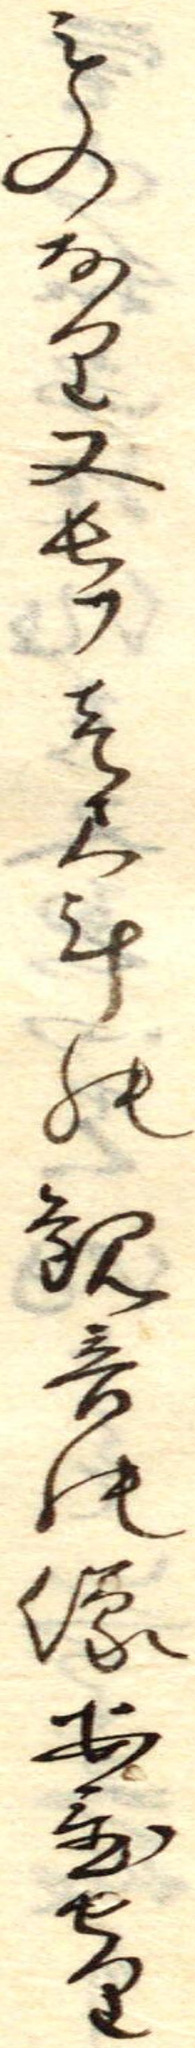ものなり又長さ壱尺斗の観音の像安置せり

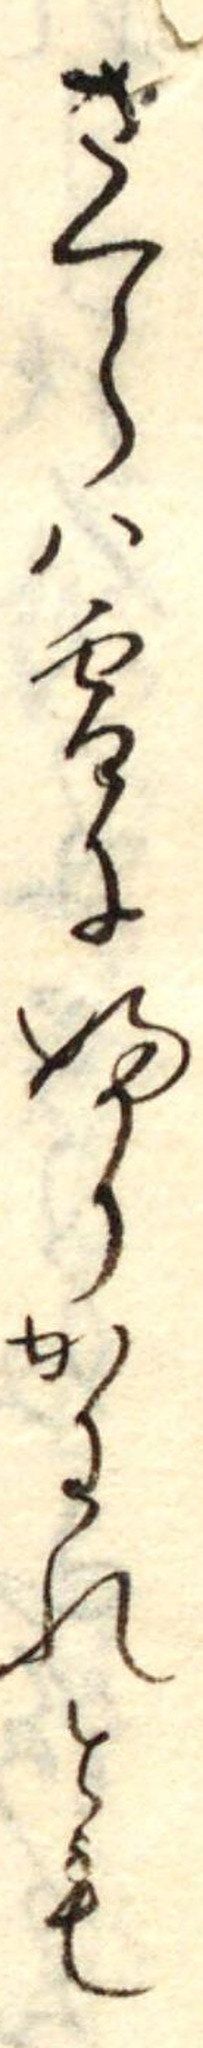さくらは雪にふりかわれとも
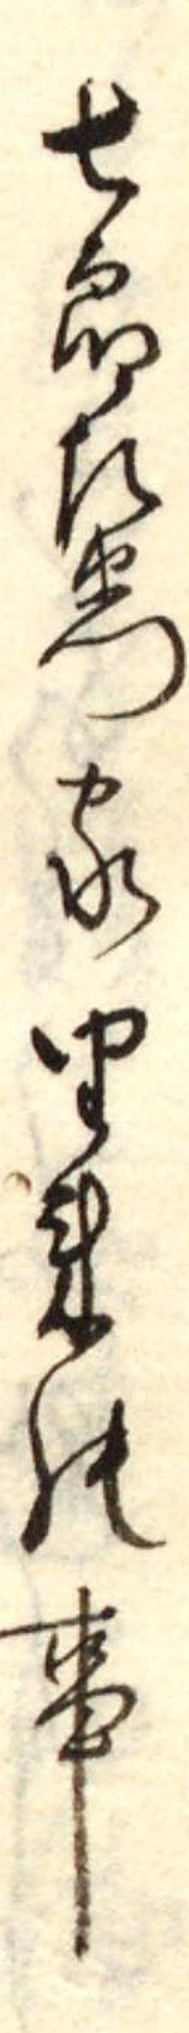七郎左衛門家由来の事
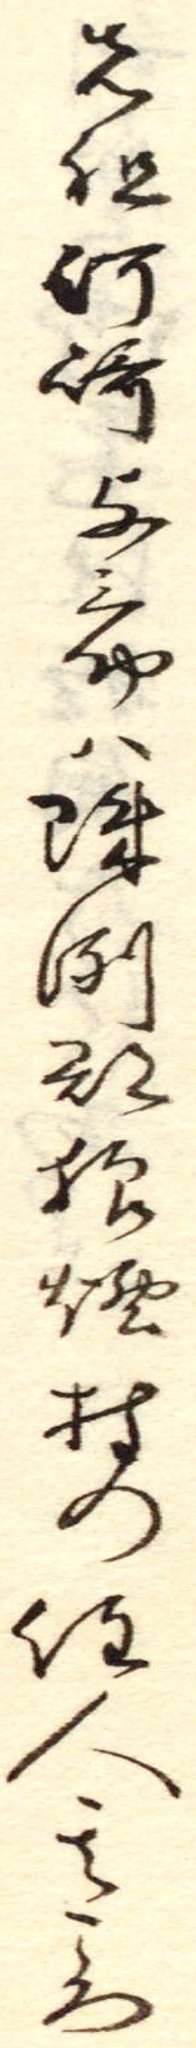先祖河崎与三助は珠洲郡狼煙村の住人其ころ
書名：能登名跡誌
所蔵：Ishikawa Prefectural Library
